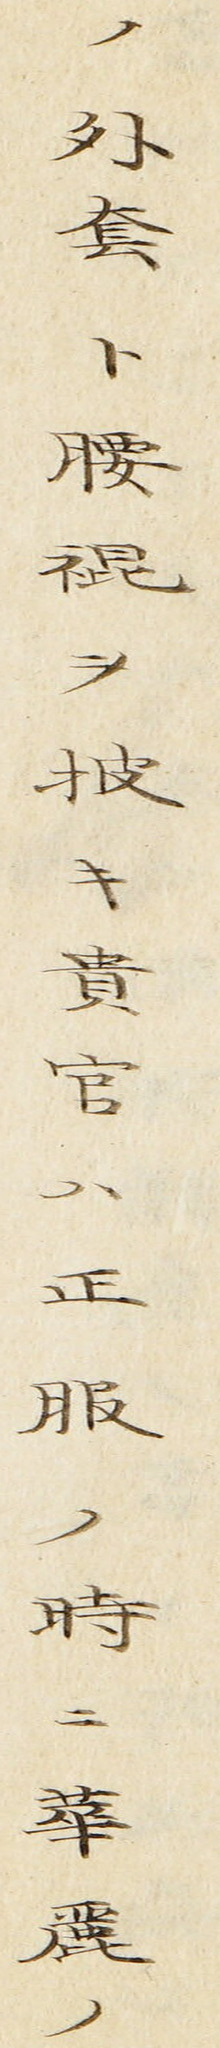ノ外套ト腰裩ヲ披キ貴官ハ正服ノ時ニ華麗ノ
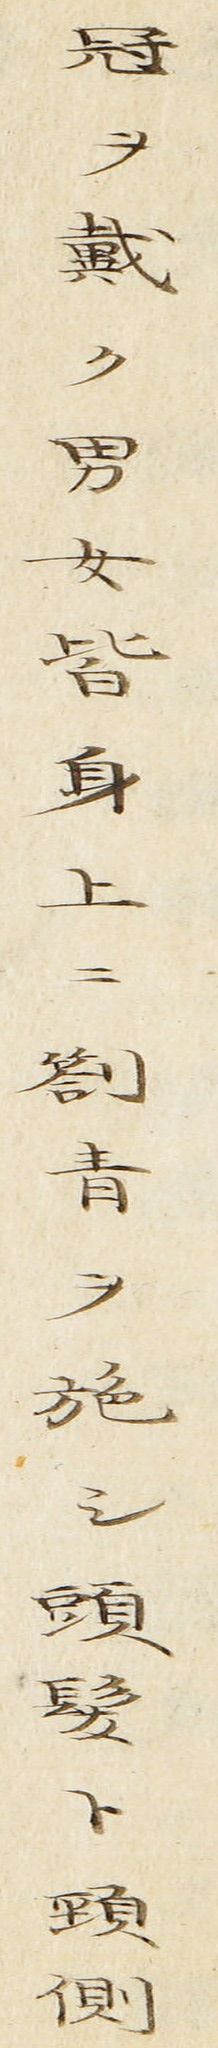冠ヲ戴ク男女皆身上ニ劄青ヲ施シ頭髪ト頸側
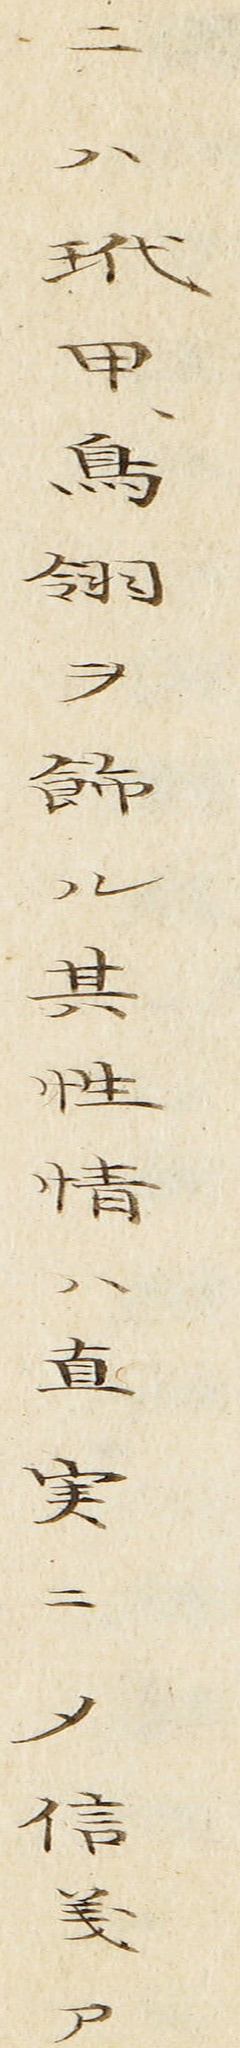ニハ玳甲、鳥翎ヲ飾ル其性情ハ直実ニシテ信義ア
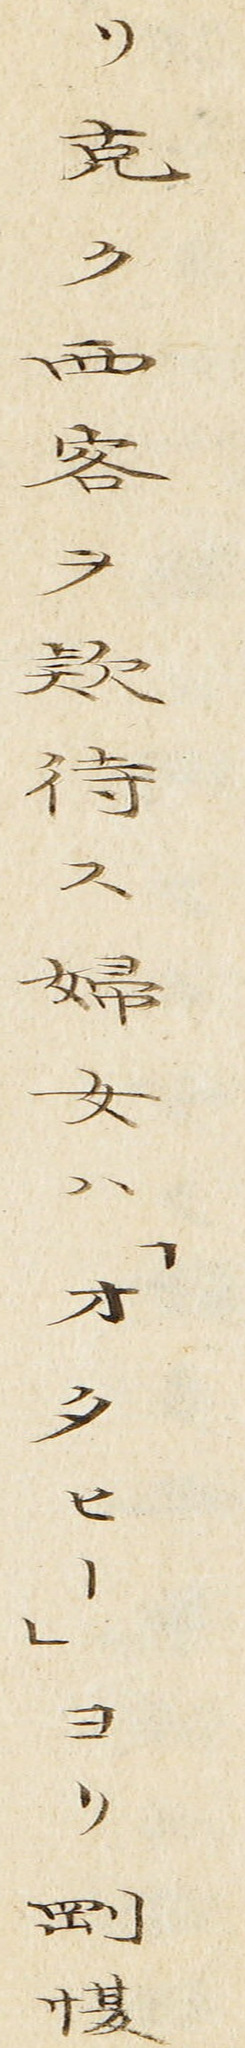リ克ク西客ヲ欵待ス婦女ハ「オタヒー」ヨリ剛愎
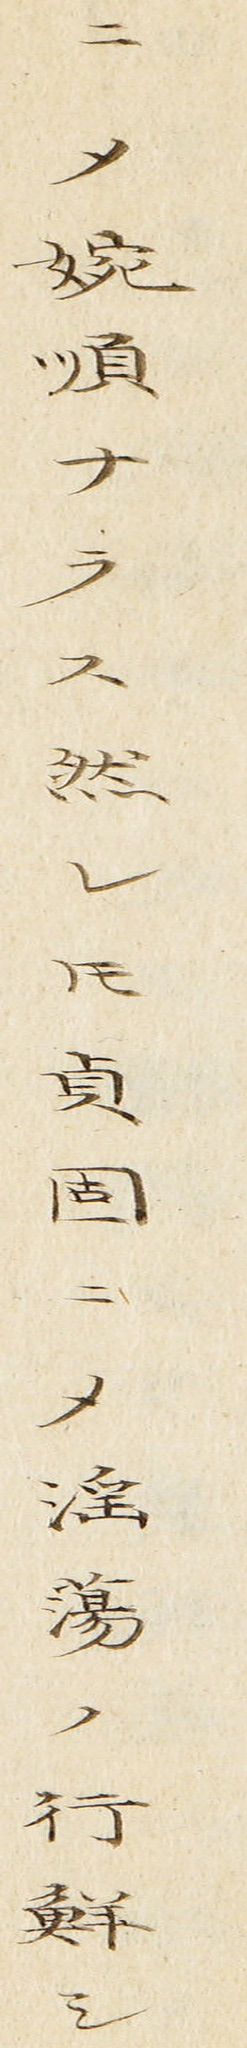ニシテ婉順ナラス然レトモ貞固ニシテ淫蕩ノ行鮮シ
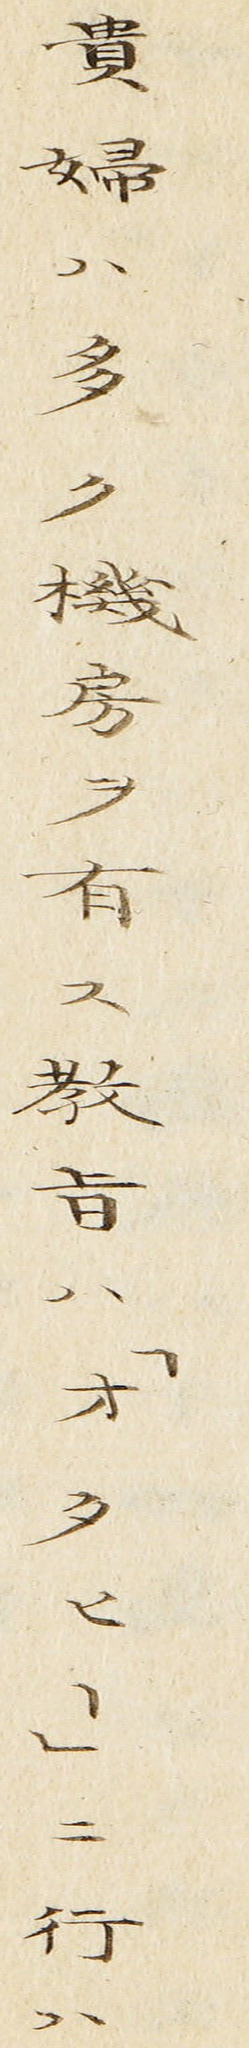貴婦ハ多ク機房ヲ有ス教旨ハ「オタヒー」ニ行ハ
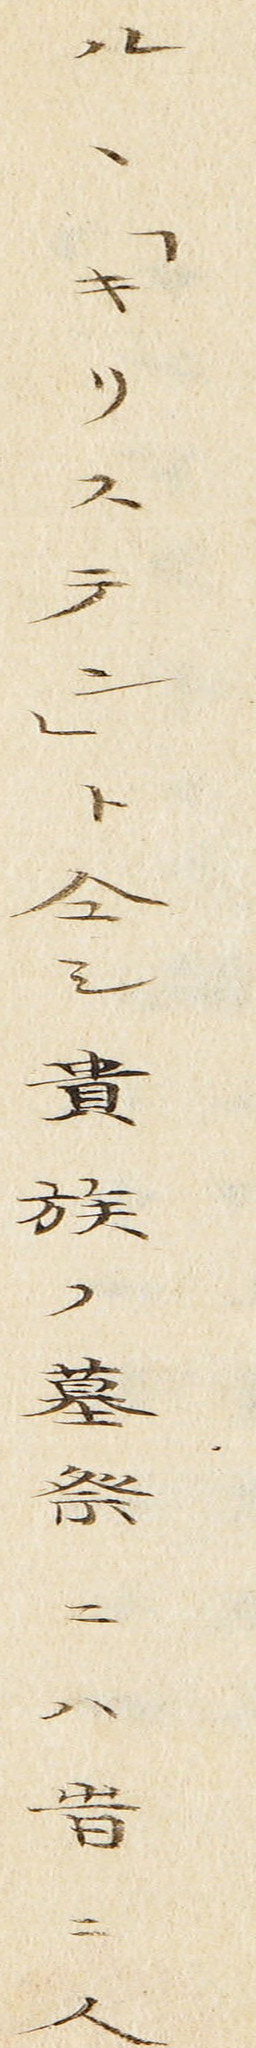ルヽ「キリステン」ト仝シ貴族ノ墓祭ニハ旹ニ人
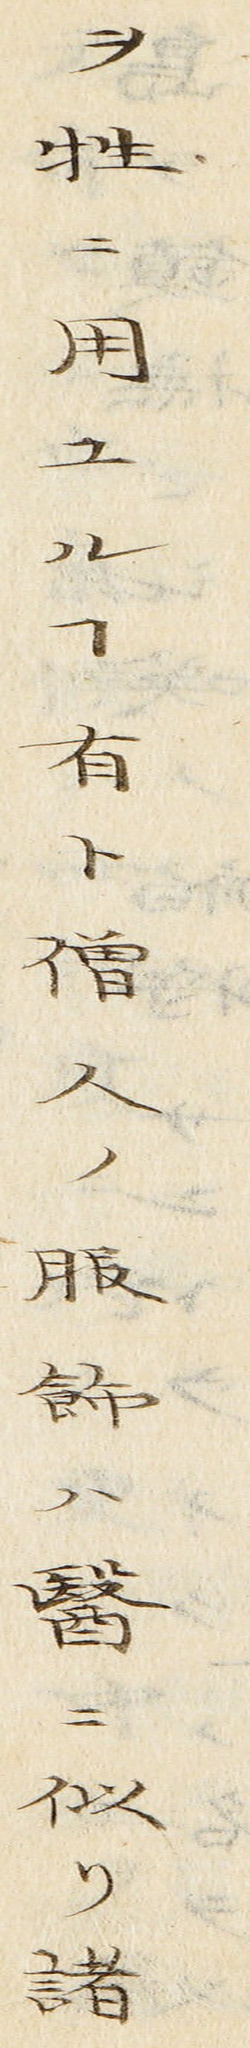ヲ牲ニ用ユルコト有ト僧人ノ服飾ハ醫ニ似リ諸
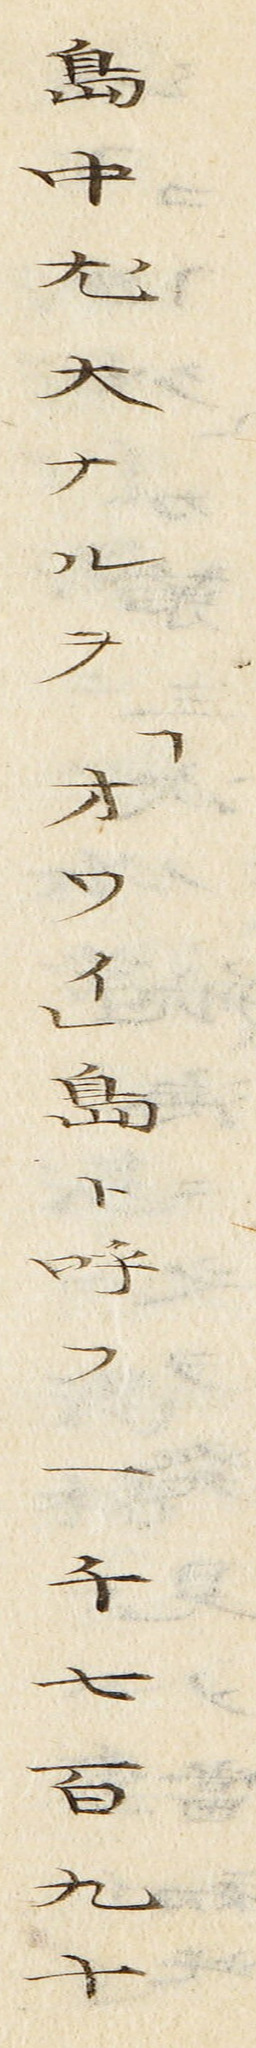島中尤大ナルヲ「オワイ」島ト呼フ一千七百九十
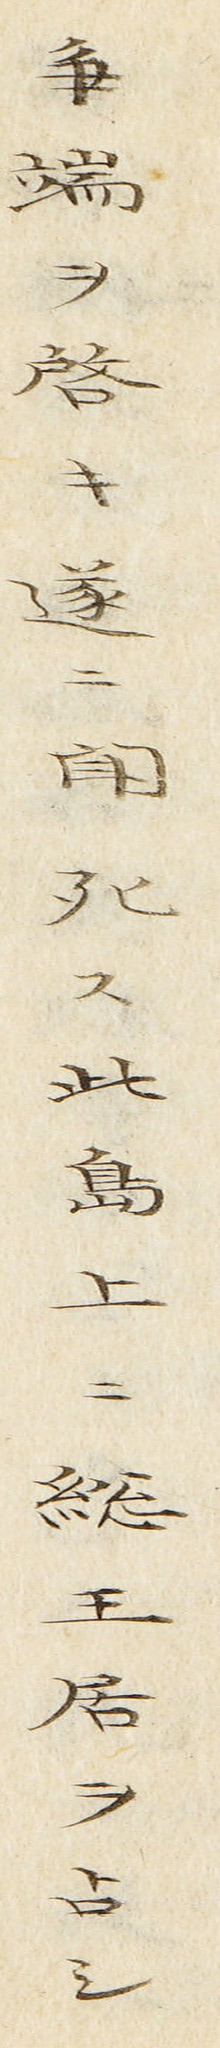争端ヲ啓キ遂ニ閗死ス此島上ニ総王居ヲ占シ
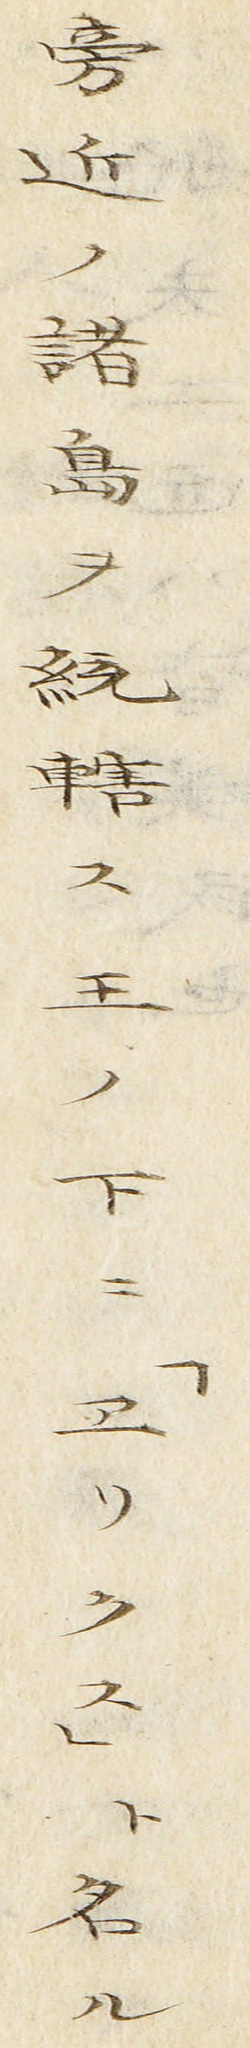旁近ノ諸島ヲ統括ス王ノ下ニ「ヱリクス」ト名ル
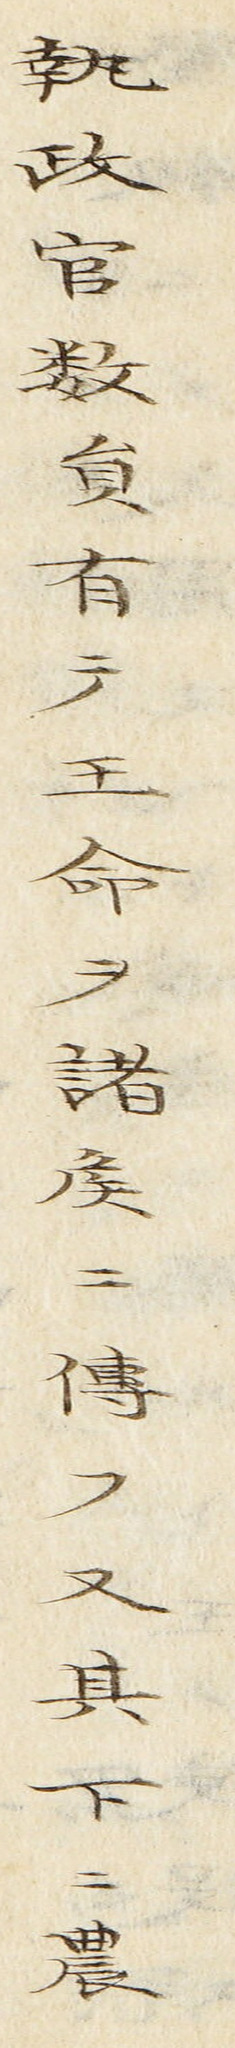執政官数員有テ王命ヲ諸矦ニ傳フ又其下ニ農
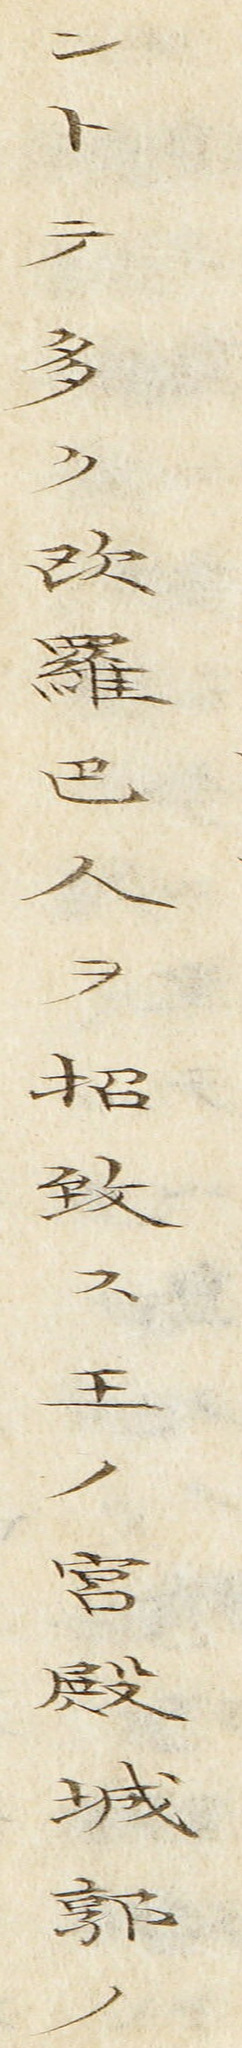ントテ多ク欧羅巴人ヲ招致ス王ノ宮殿城郭ノ
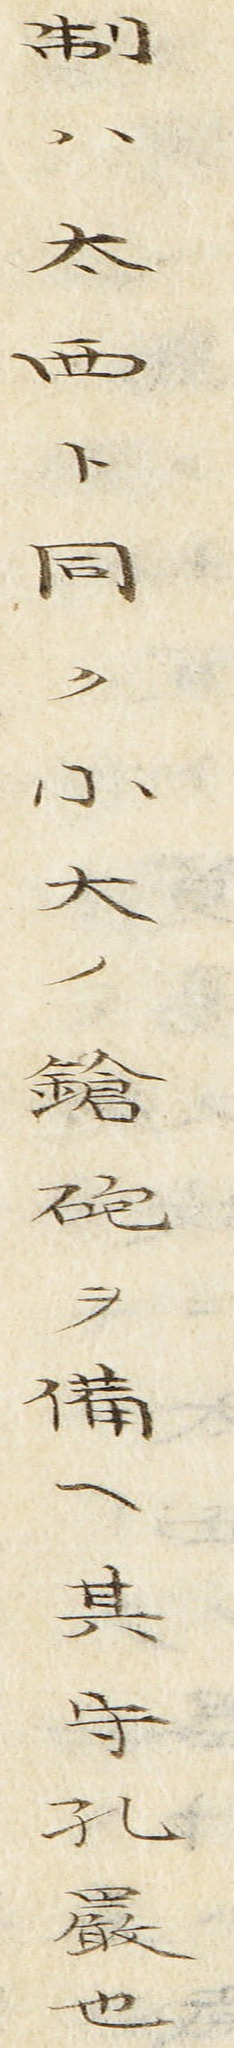制ハ太西ト同ク小大ノ鎗砲ヲ備ヘ其守孔嚴也
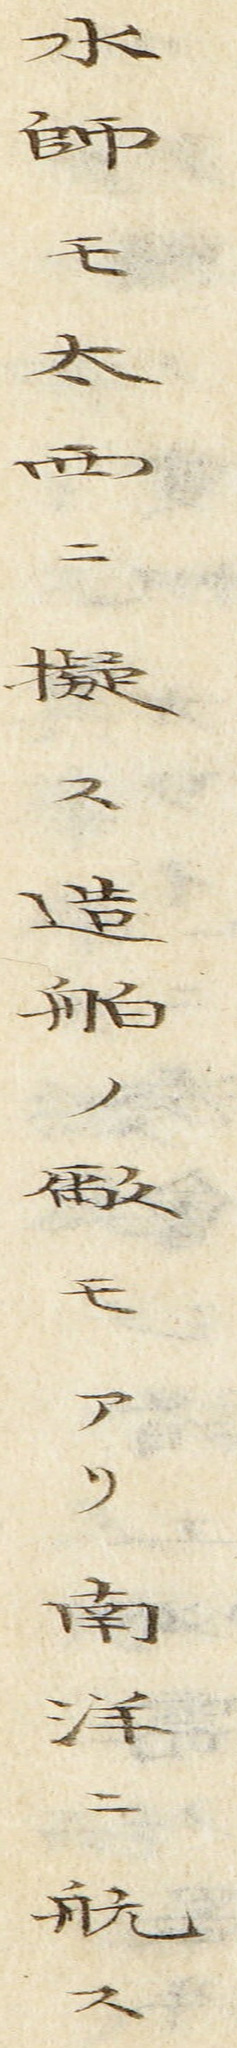水師モ太西ニ擬ス造船ノ敝モアリ南洋ニ航ス

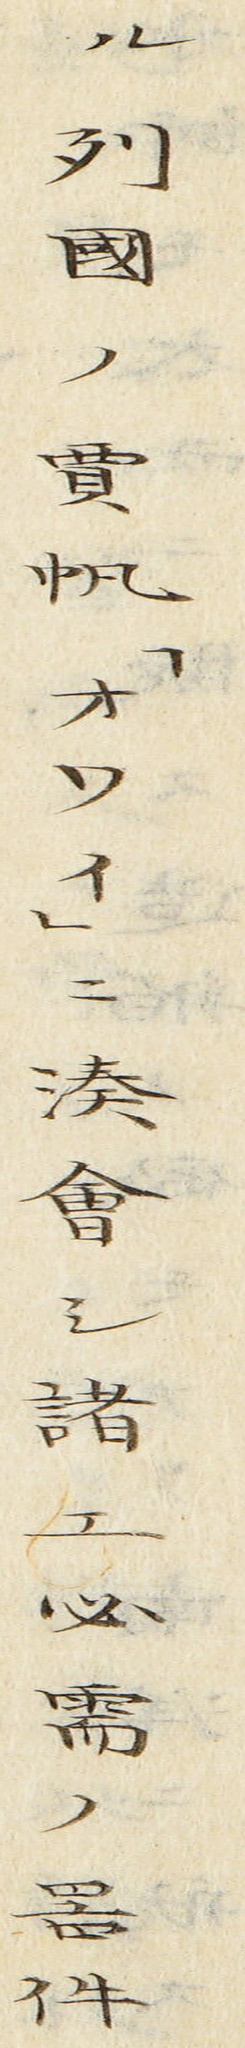ル列國ノ賈帆「オワイ」ニ湊會シ諸工必需ノ器件
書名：蕃談
